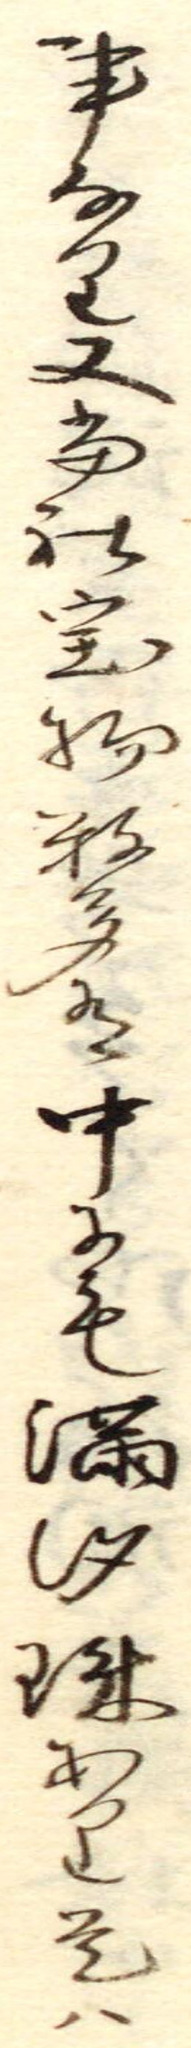事なり又当社宝物数多有中にも満汐珠あり是は
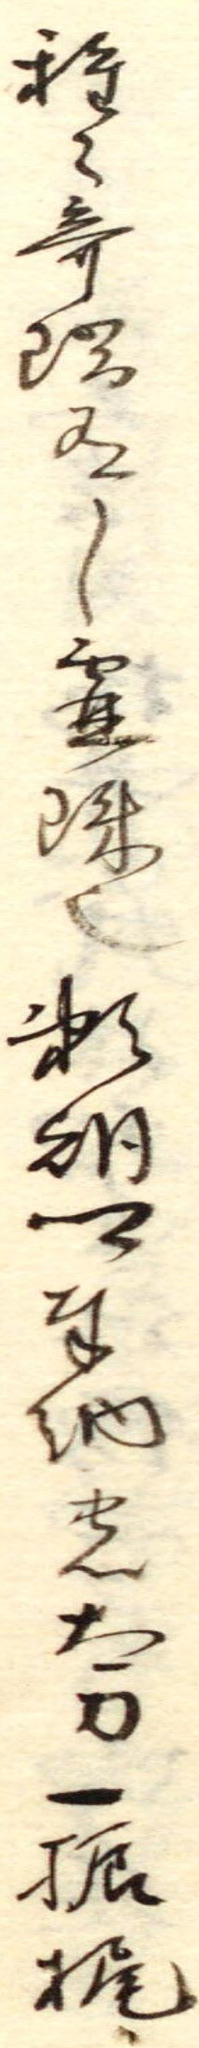種々奇瑞有し霊珠也頼朝卿奉納の太刀一振梶
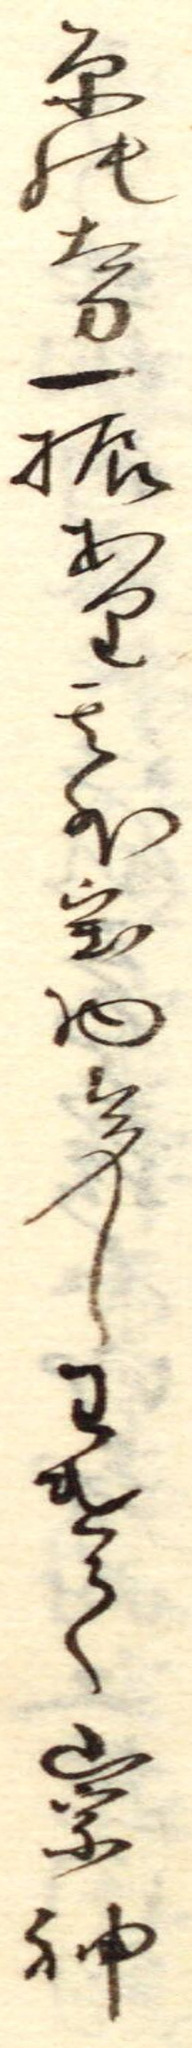原の太刀一振あり其外宝物多しわけて崇神
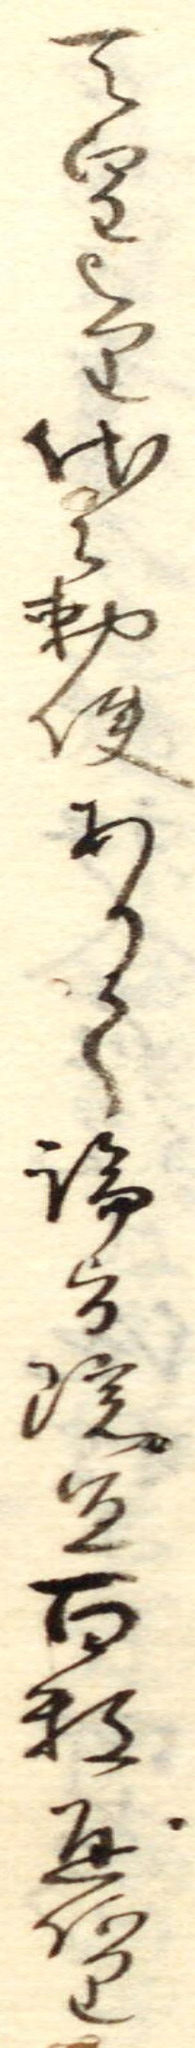天皇より代々勅使ありて綸旨院宣百数通あり
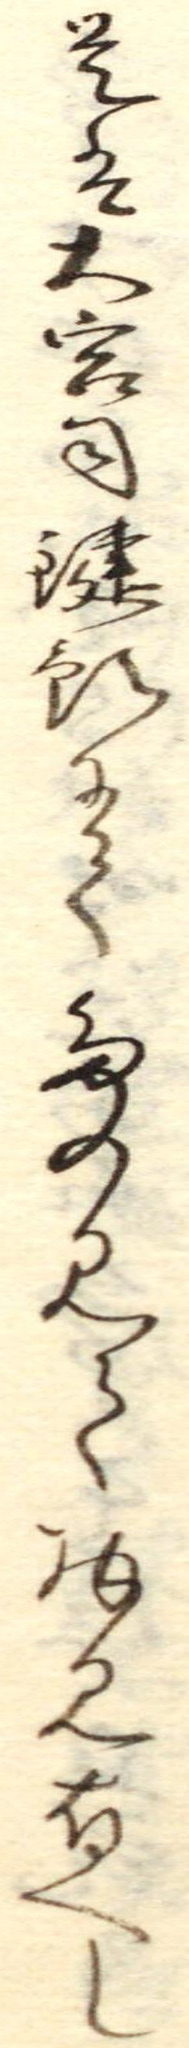是は大宮司鍵預にてたのみて拝見有へし
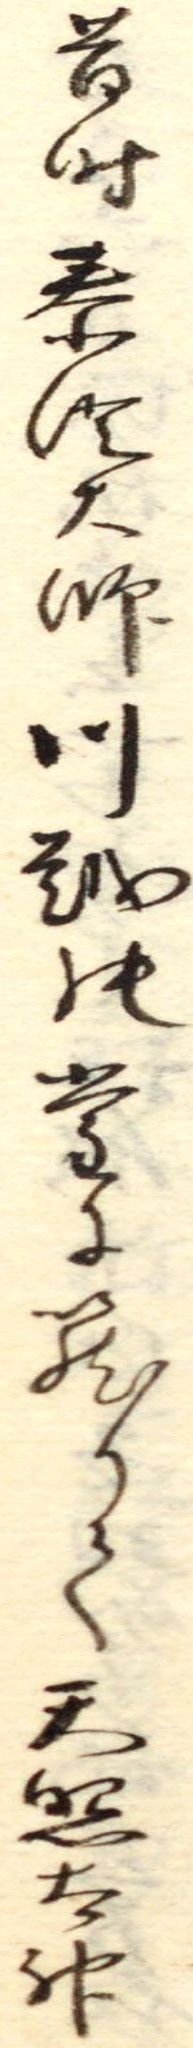昔時泰澄大師川越の堂に籠りて天照太神
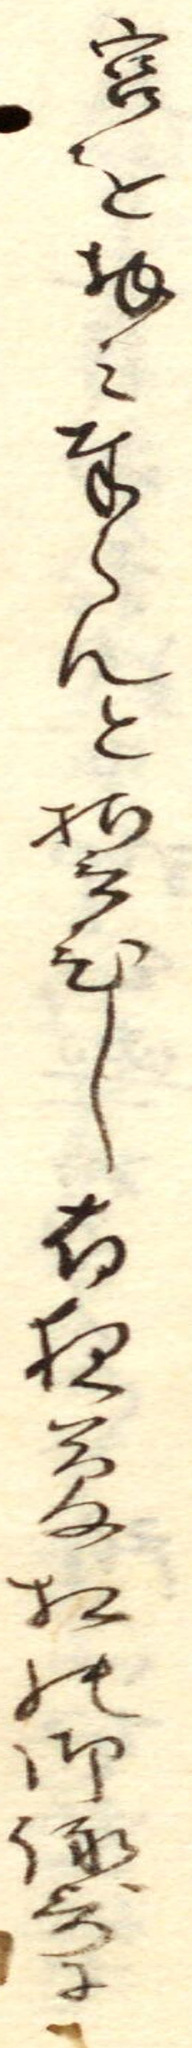宮を拝み奉らんと誓ひし有夜夢相の御詠哥に
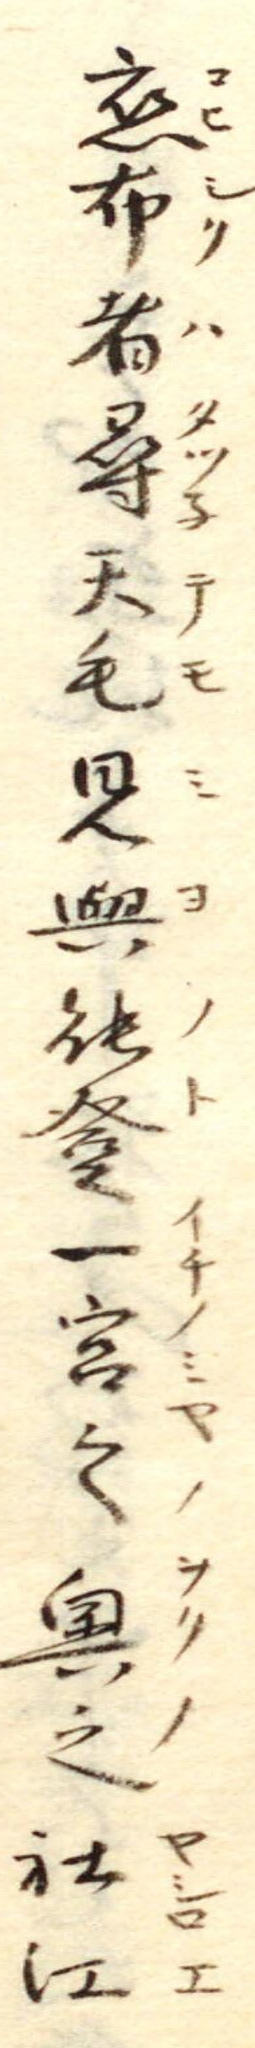恋布者尋天毛見與能登一宮之奥之社江
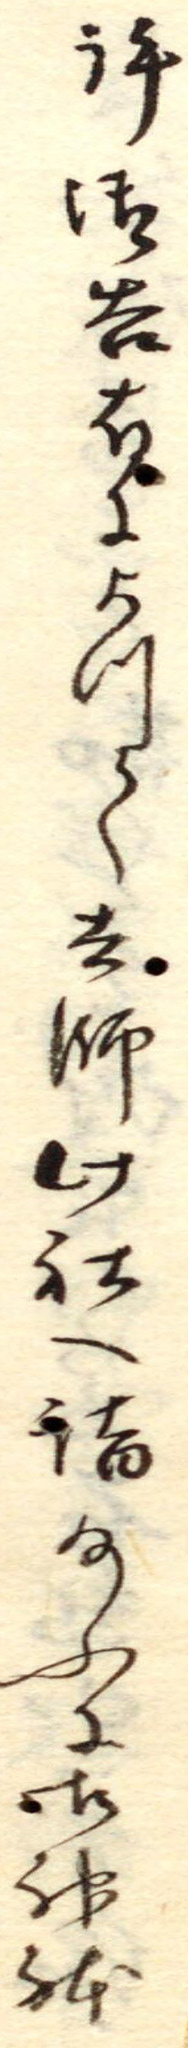許御告有によつて去師此社へ詣給ふに御神体
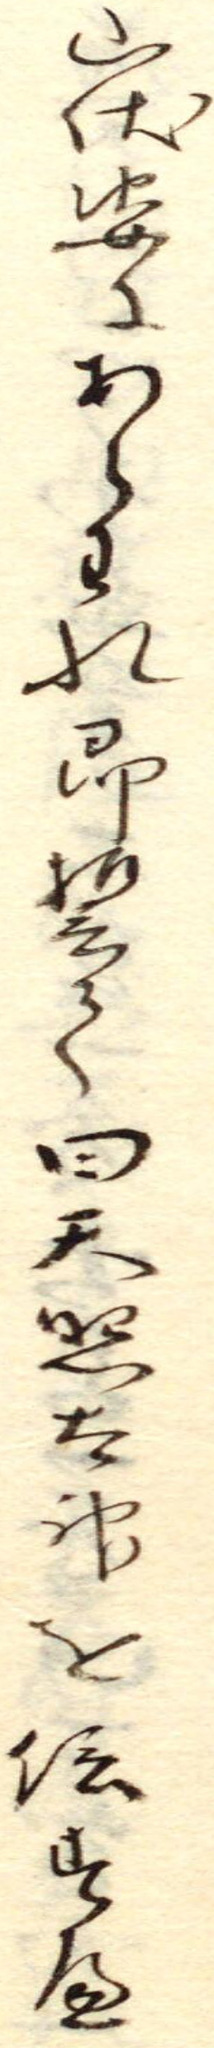山伏姿にあらわれ即誓て曰天照太神を信すへ
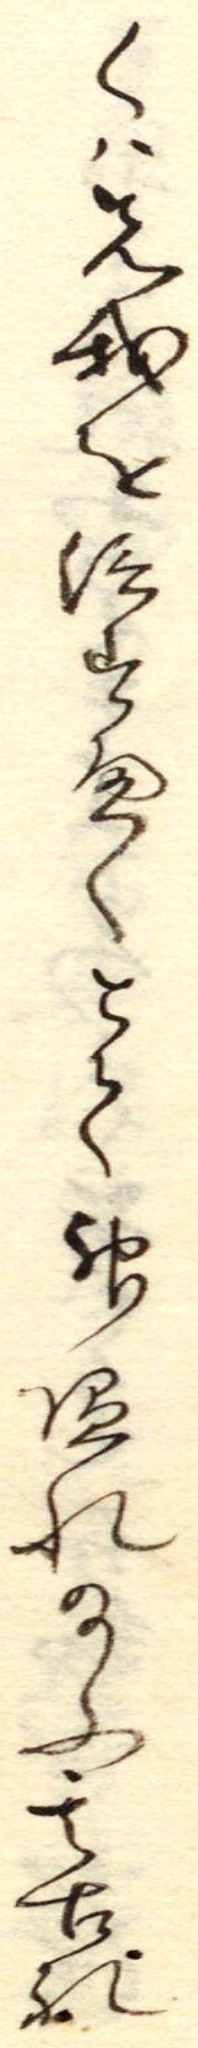くは先我を信すへくとて神隠れ給ふ其古礼
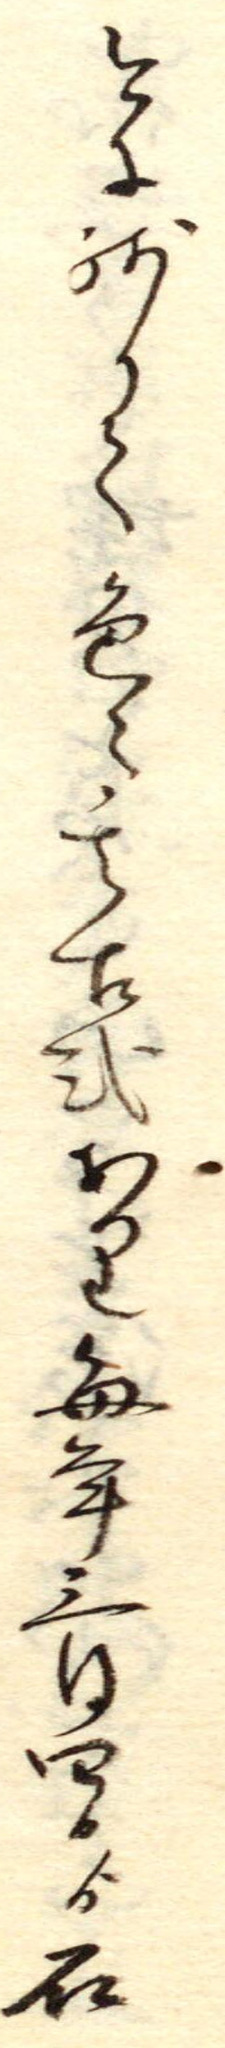今に残りて色々古式あり毎年三月四日ゟ石
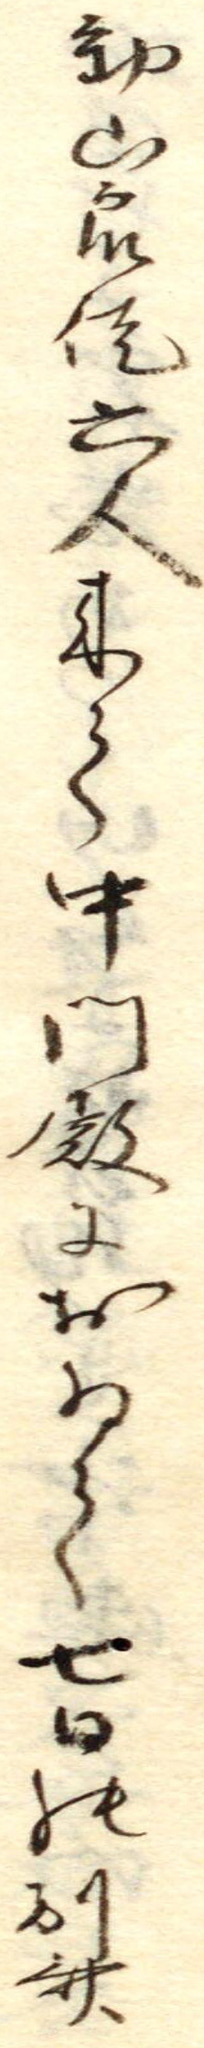動山衆徒六人来て中門殿におゐて七日の別齋
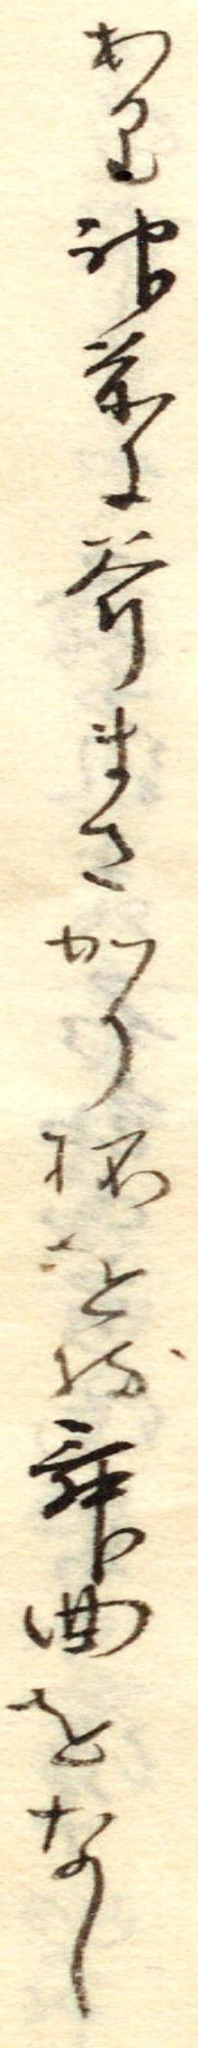あり神前に斧まさかり抔を持舞曲をなし
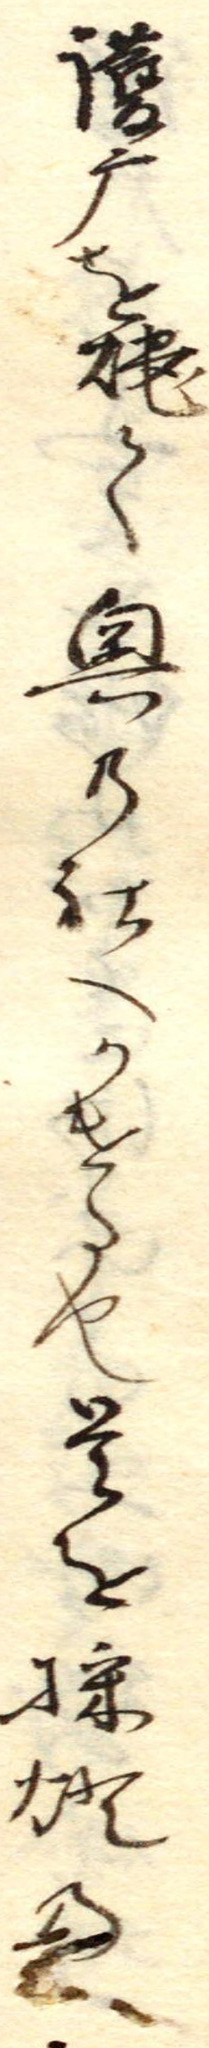護摩を焼て奥の社へかける也是を採燈の

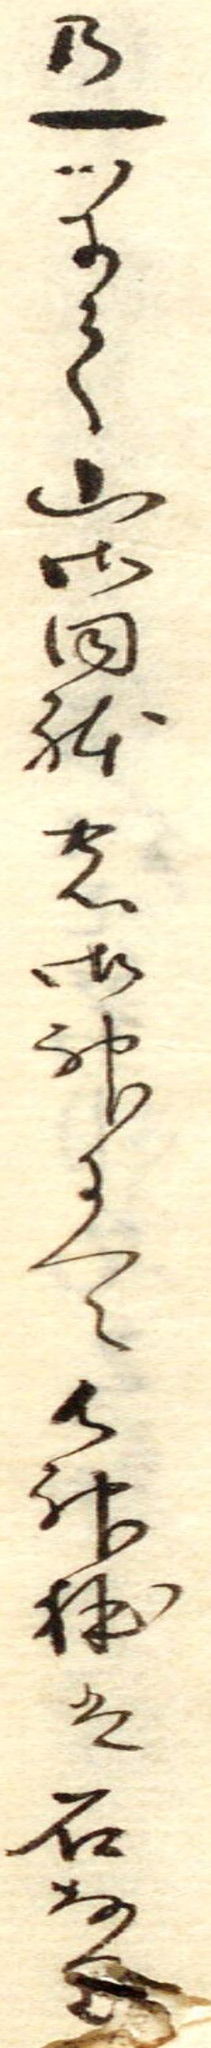の一ツにて山御同躰の御神にて御神躰は石なり
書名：能登名跡誌
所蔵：Ishikawa Prefectural Library
